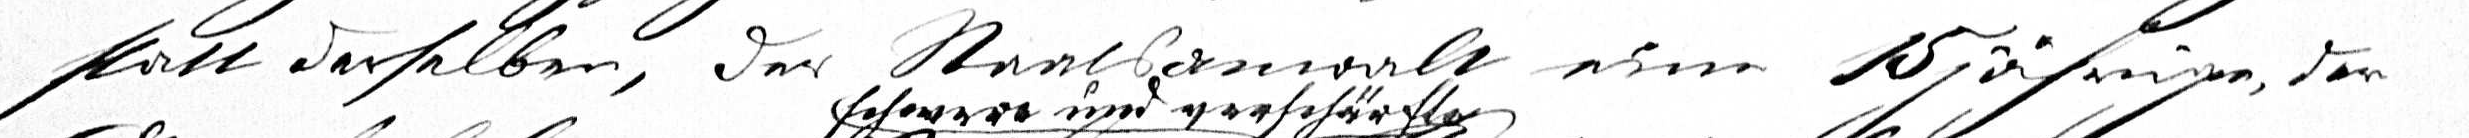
statt derselben, der Staatsanwalt eine 15jährige, der
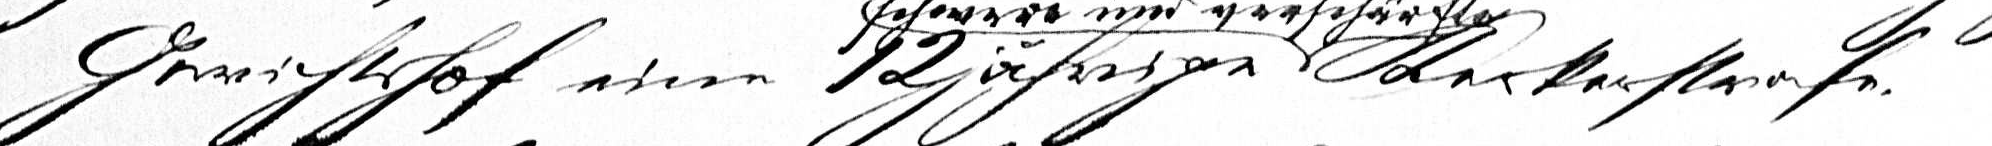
Gerichtshof eine 12 jährige Kerkerstrafe.
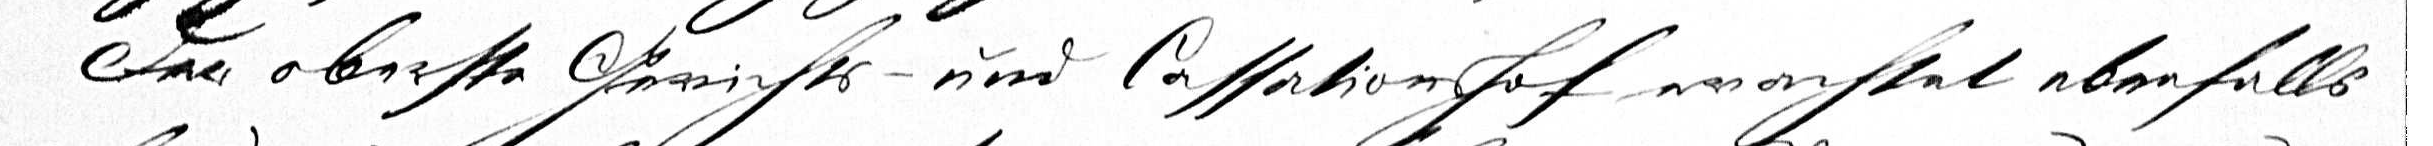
Der oberste Gerichts- und Cassationshof erachtet ebenfalls
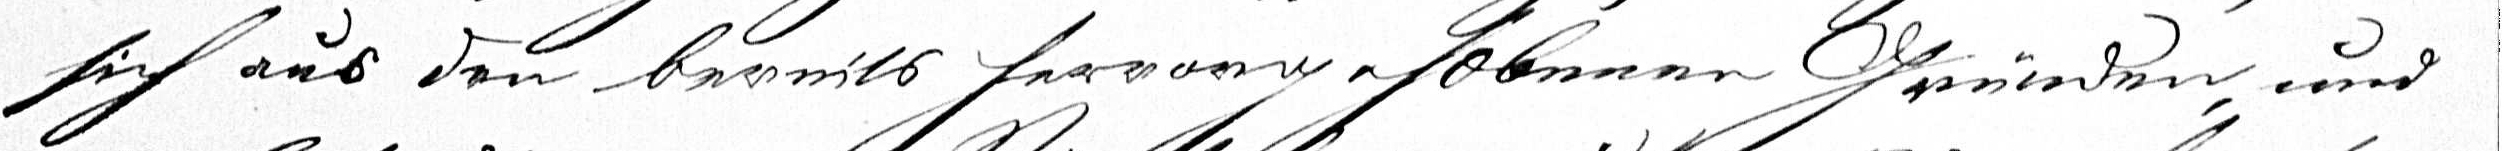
sich aus den bereits hervorgehobenen Gründen, und
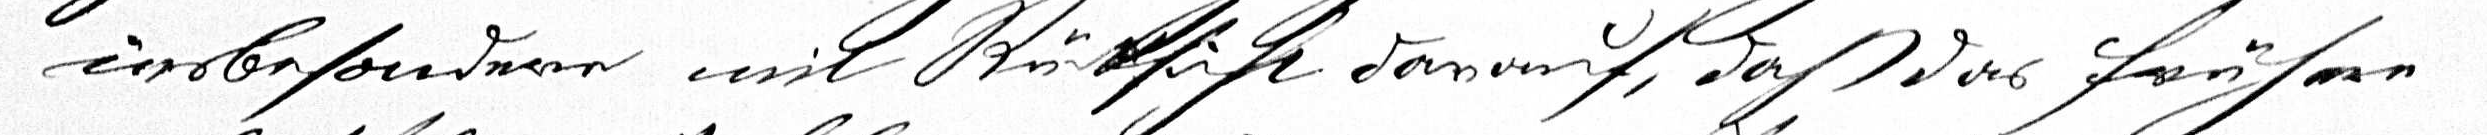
insbesondere mit Rücksicht darauf, daß das Frühere
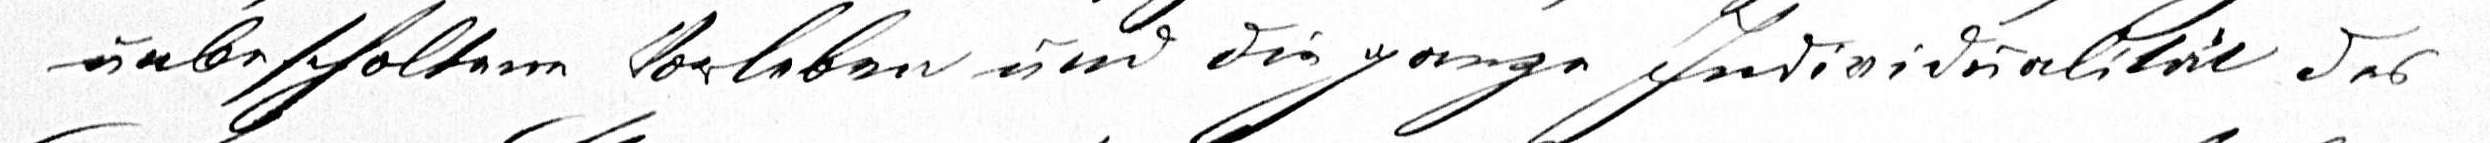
unbescholtene Vorleben und die ganze Jndividualität des
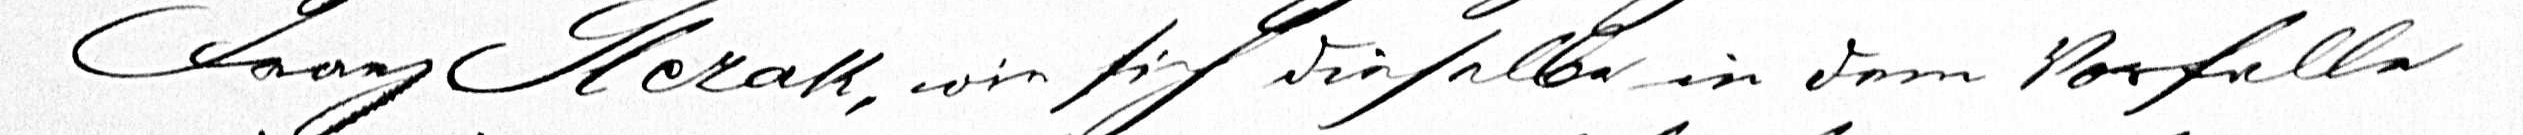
Franz Slezak, wie sich dieselbe in dem Vorfalle
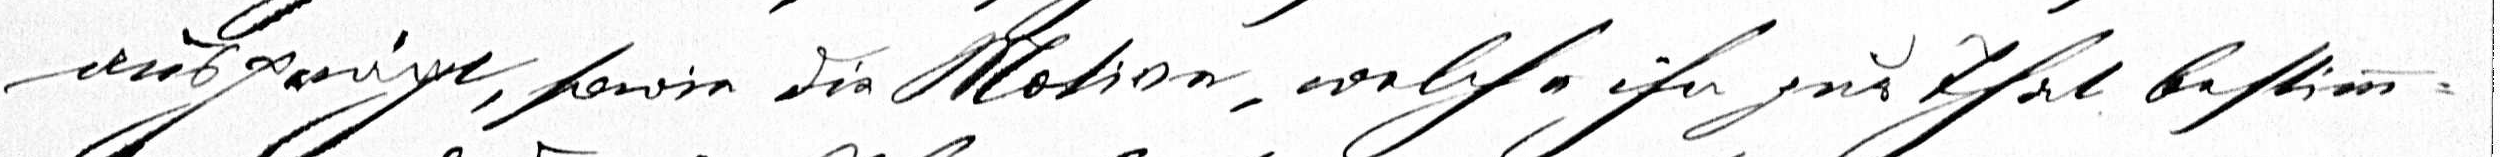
ausprägt, sowie die Motive, welche ihn zur That bestimm¬
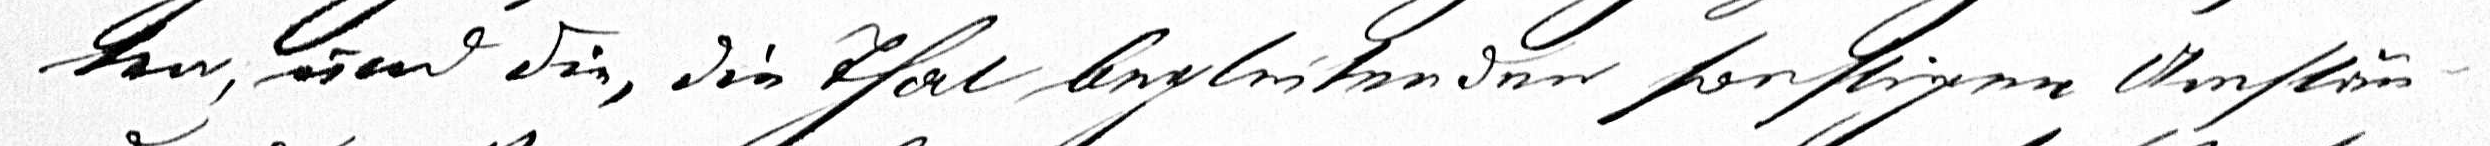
ten, und die, die That begleitenden sonstigen Umstän¬
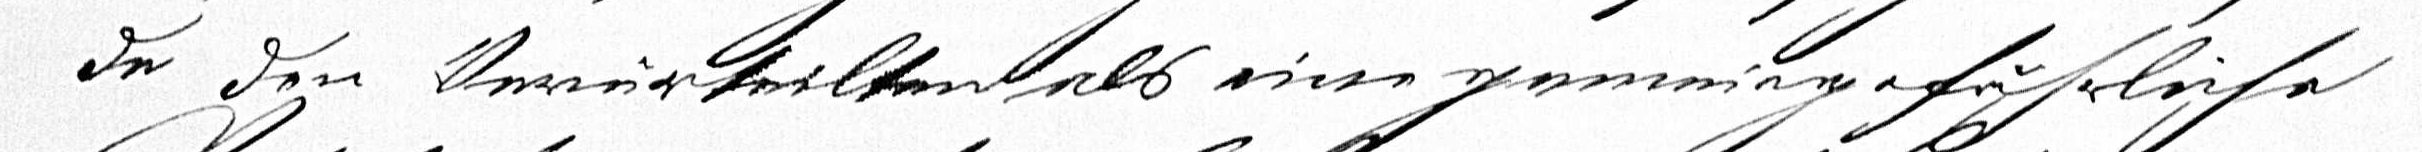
de den Verurteilten als eine gemeingefährliche
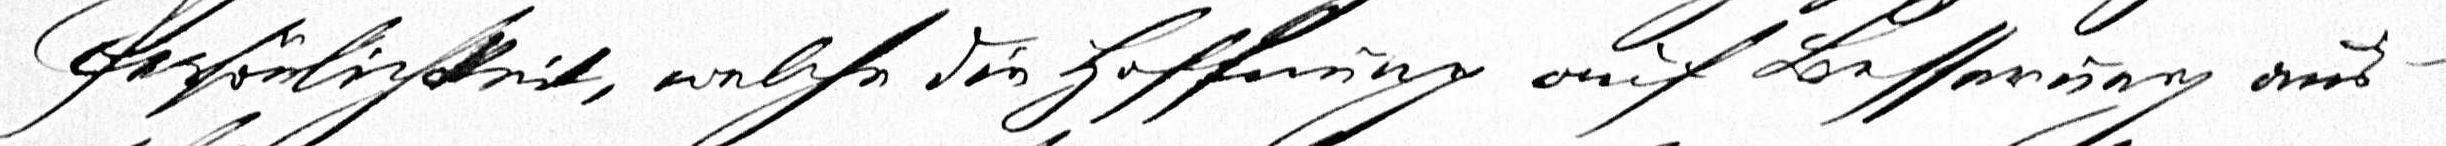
Persönlichkeit, welche die Hoffnung auf Besserung aus¬
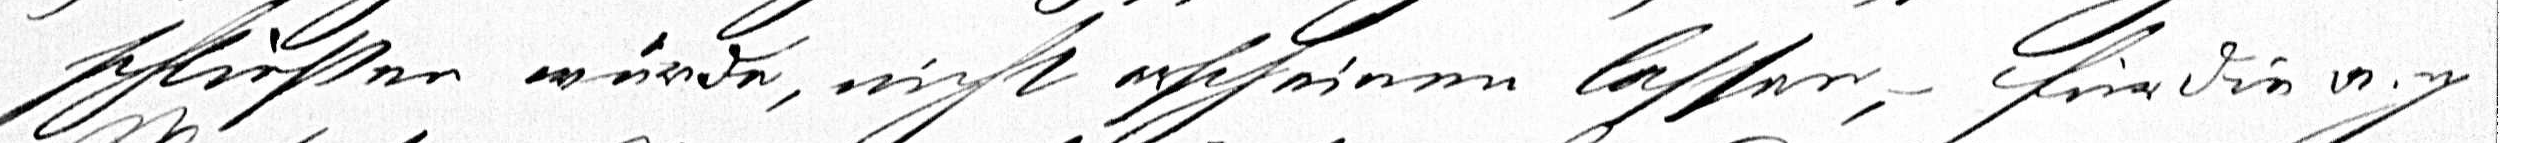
schließen wurde, nicht erscheinen lassen,- für die a. g
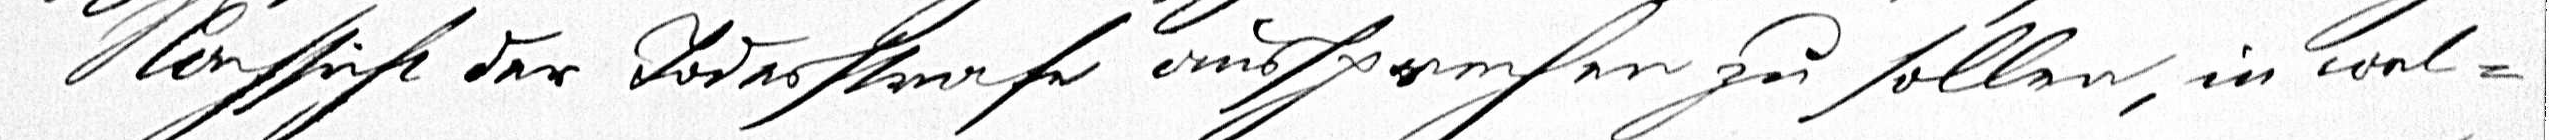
Nachsicht der Todesstrafe aussprechen zu sollen, in wel¬
